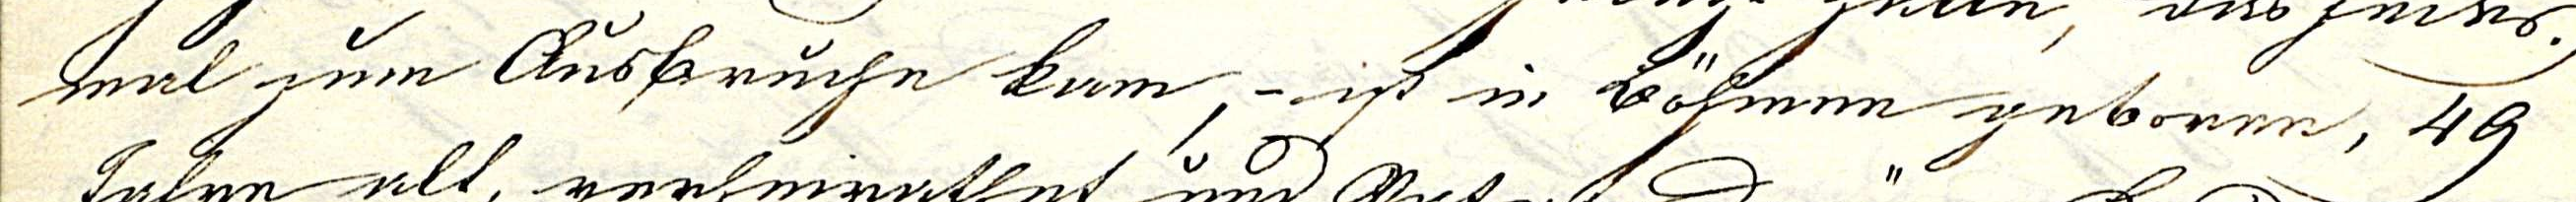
mal zum Ausbruche kam, - ist in Böhmen geboren, 49
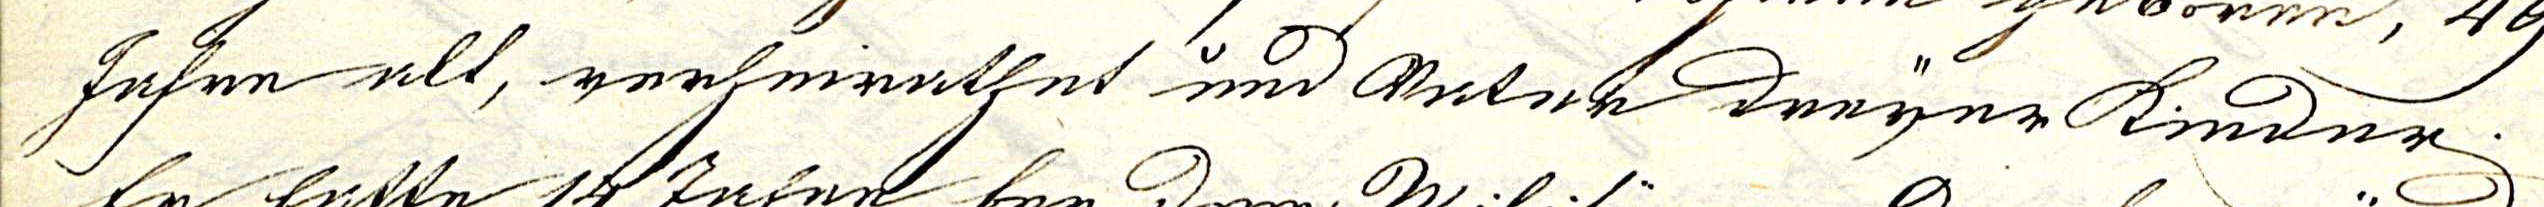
Jahre alt, verheirathet und Vater dreyer Kinder.
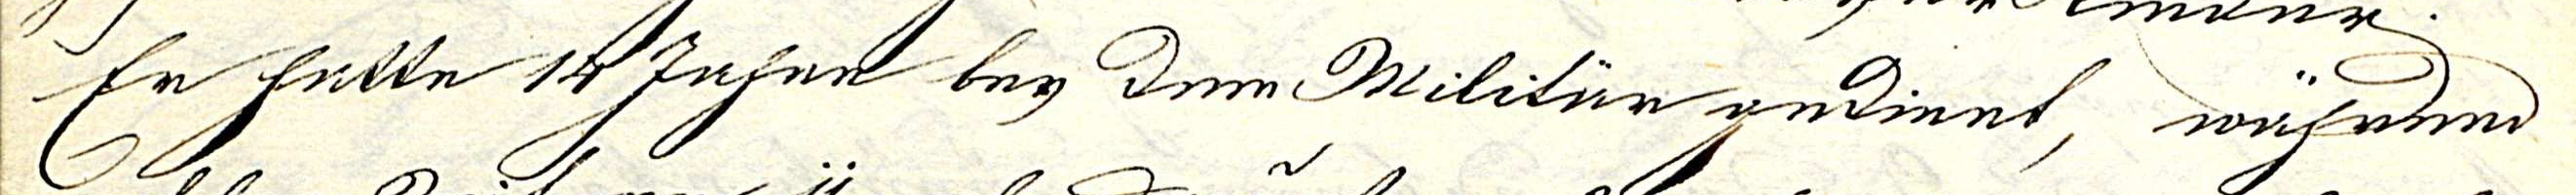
Er hatte 14 Jahre bey dem Militär gedient, während
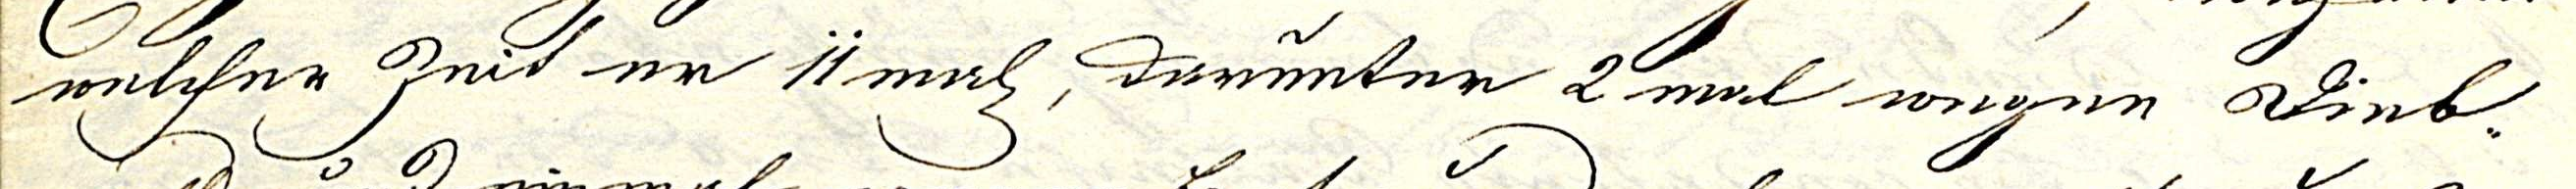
welcher Zeit er 11 mal, darunter 2 mal wegen Dieb¬
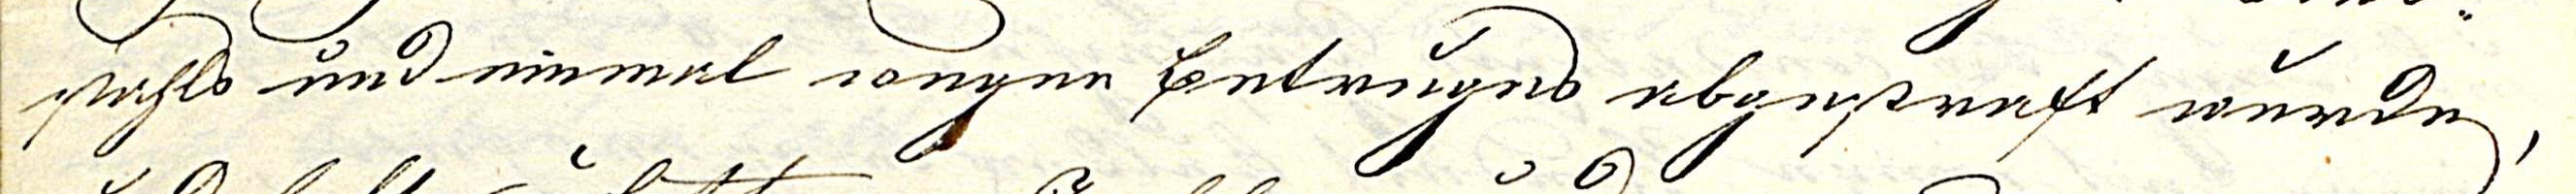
stals und einmal wegen Betruges abgestraft wurde,
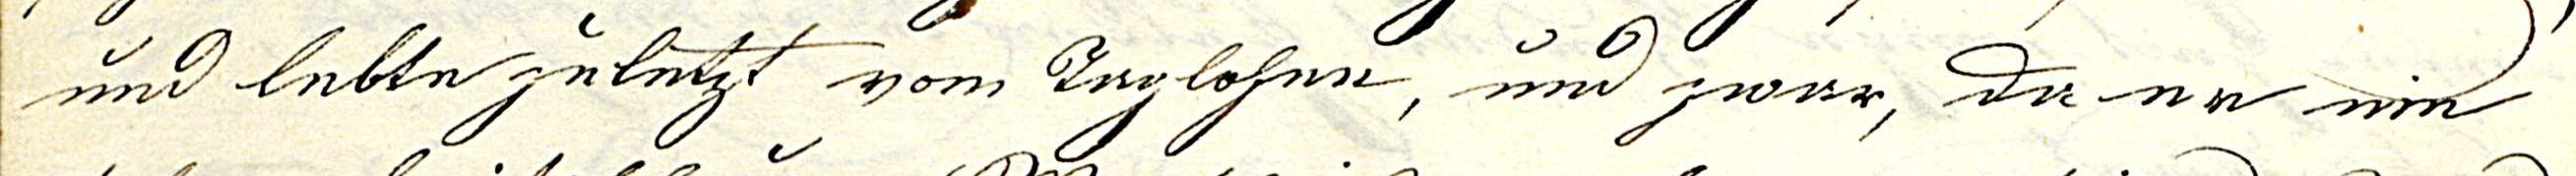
und lebte zuletzt vom Taglohne, und zwar, da er ein
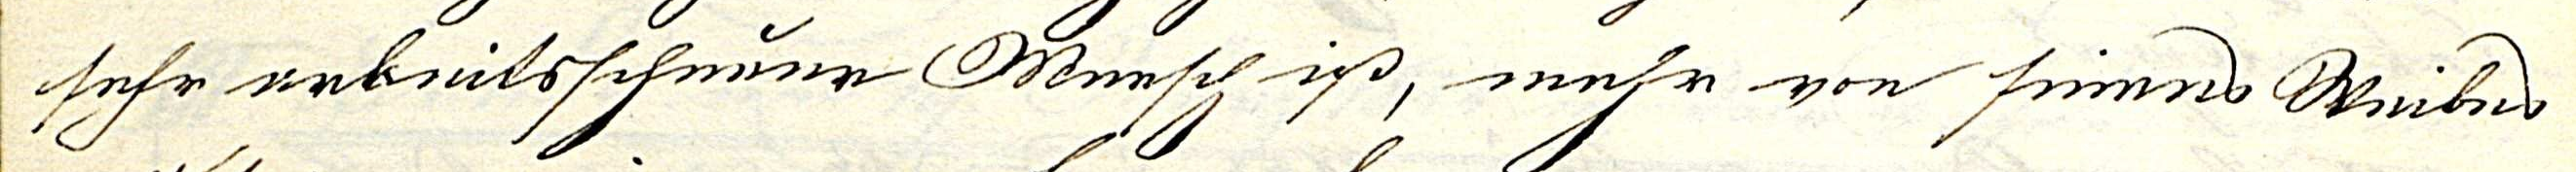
sehr arbeitsscheuer Mensch ist, mehr von seines Weibes
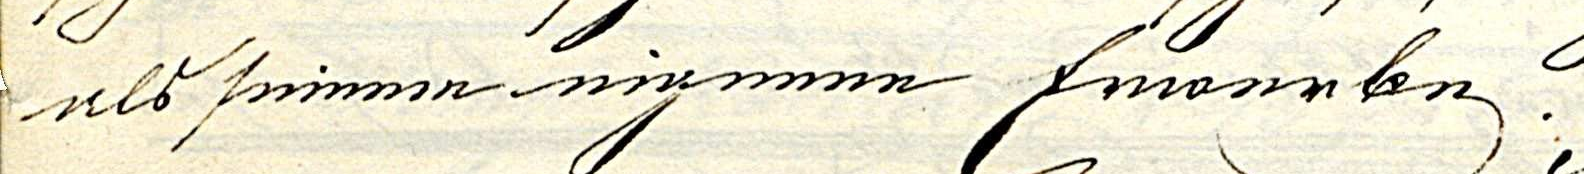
als seinem eigenen Erwerbe.
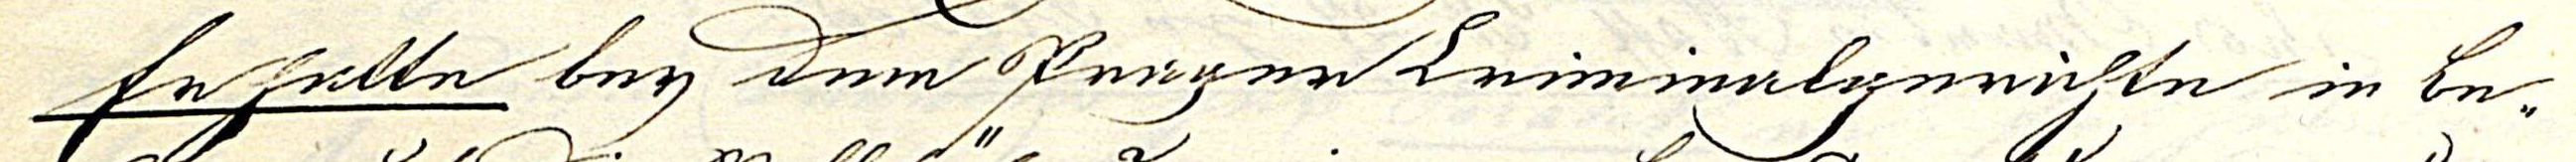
Erhalte by dem Prager Criminalgerichte in Be¬
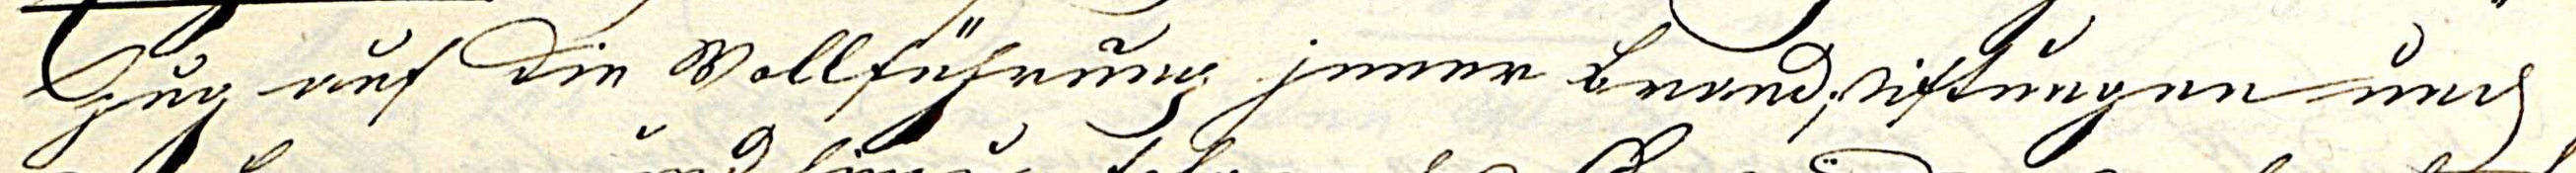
zug auf die Vollführung jener Brandstiftungen auch
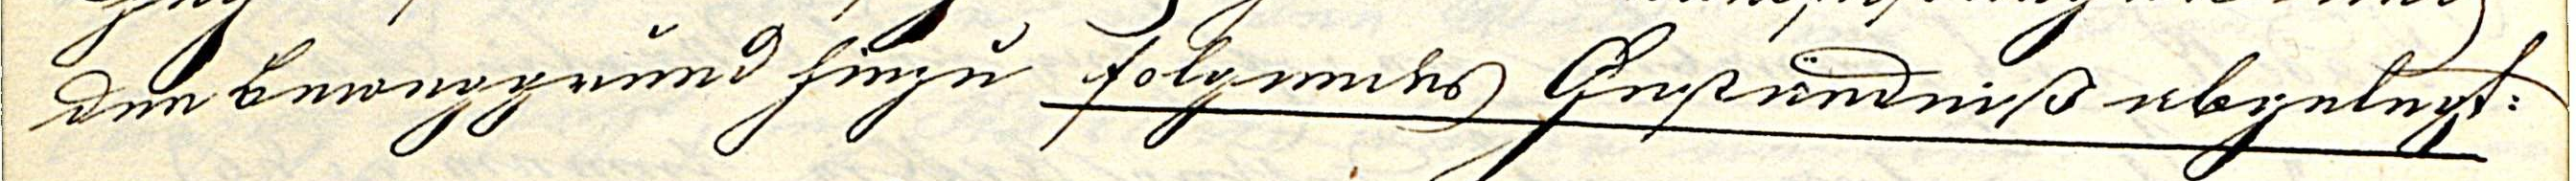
dem Beweggrund hinzu folgendes Geständniß abgelegt:
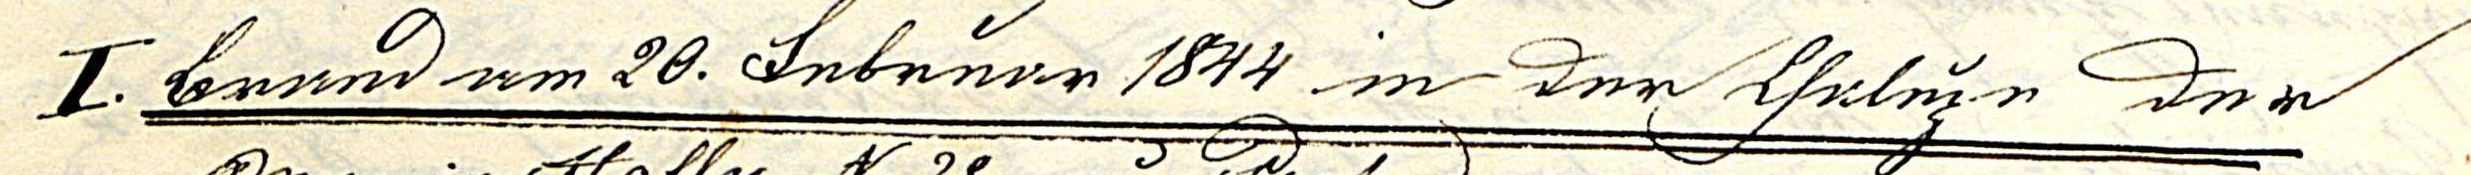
I. Brand am 20. Februar 1844 in der Chalupe der
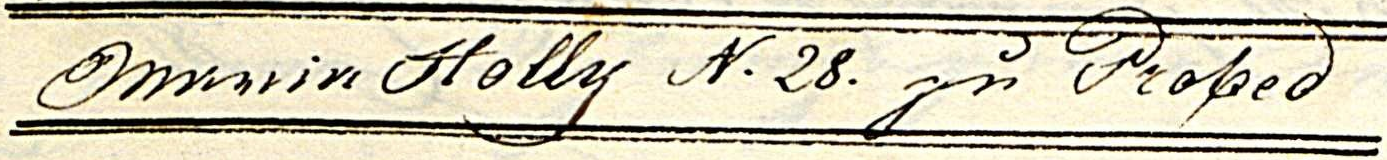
Marie Holly N. 28 zu Proped.
